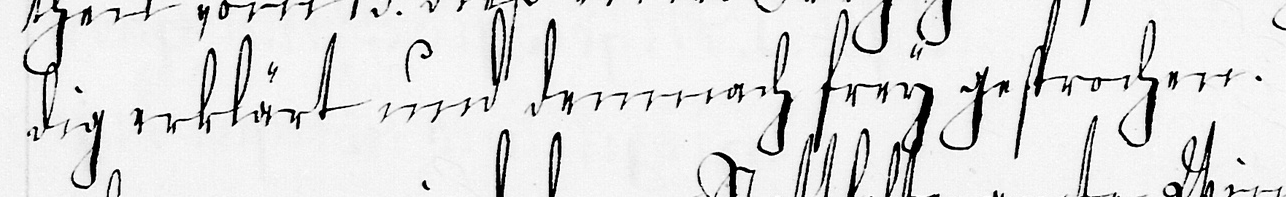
dig erklärt und demnach frey gesprochen.
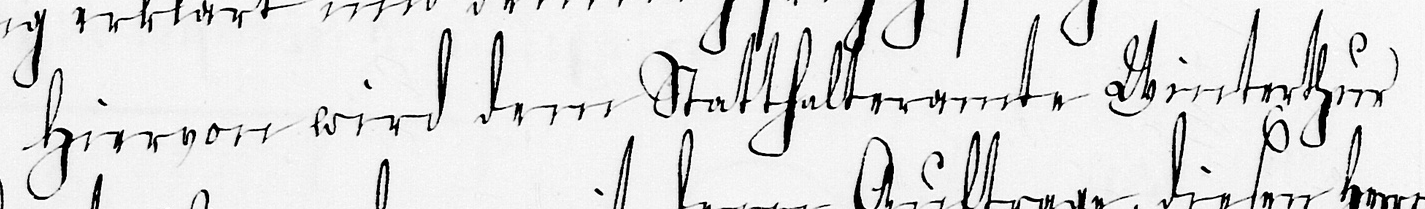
Hiervon wird dem Statthalteramte Winterthur
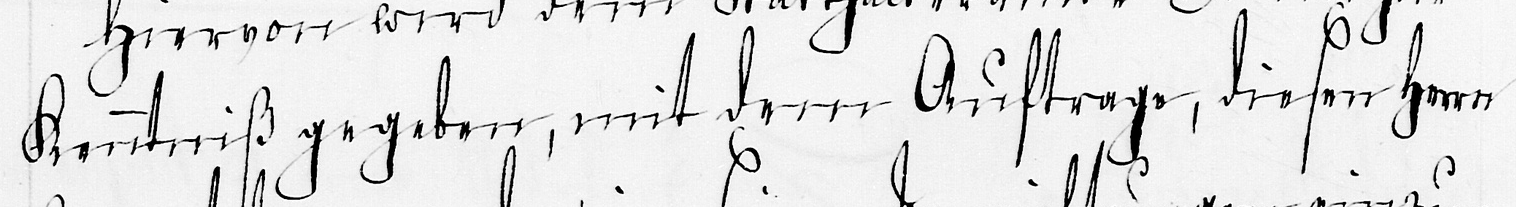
Kenntniß gegeben, mit dem Auftrage, diesen Herrn
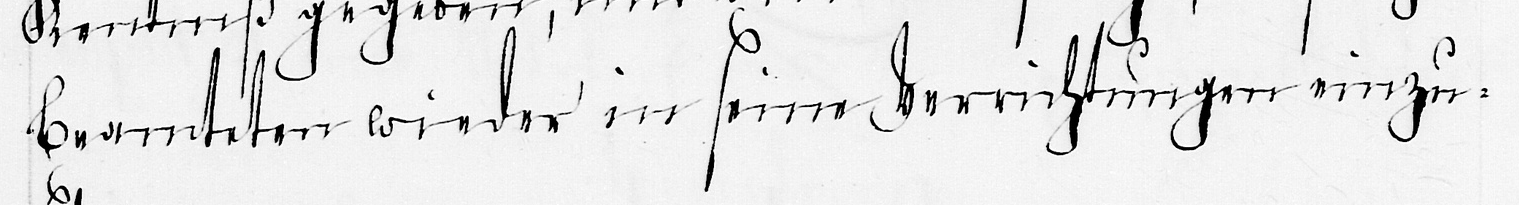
Beamteten wieder in seine Verrichtungen einzus¬
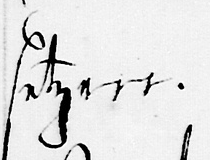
etzen.
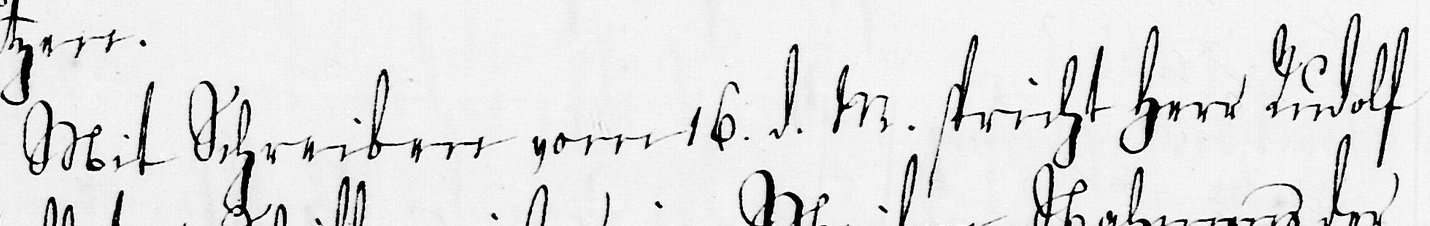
Mit Schreiben vom 16. d. M. spricht Herr Rudolf
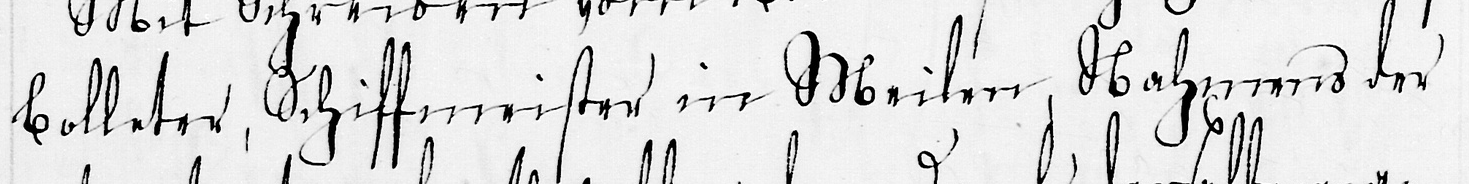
Bolleter, Schiffmeister in Meilen Nahmens der
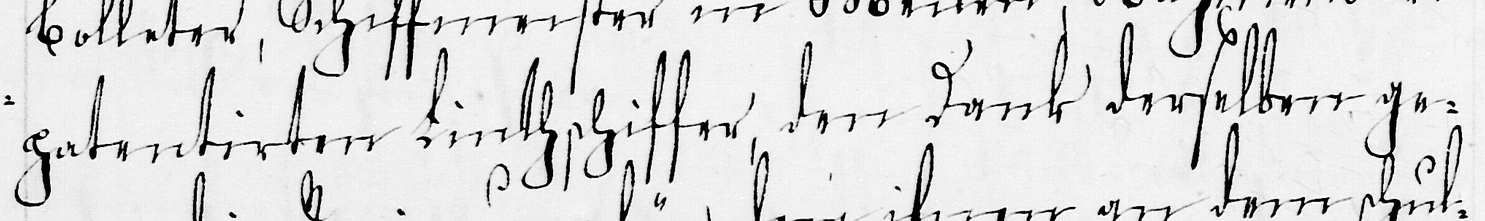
patentirten Linthschiffer den Dank derselben ge¬
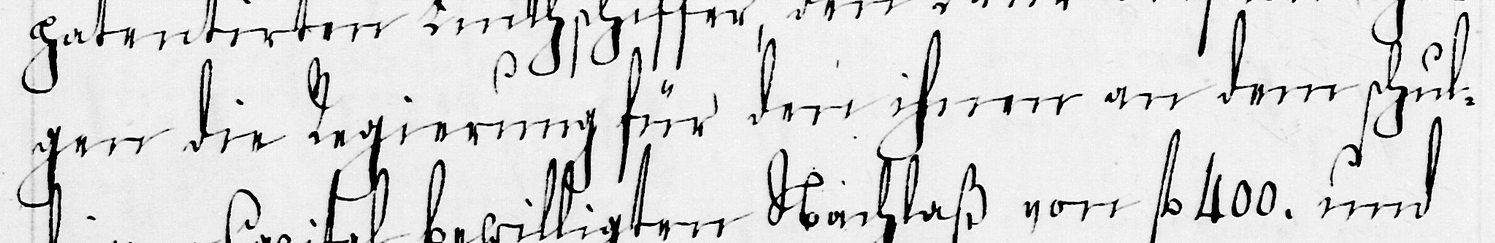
gen die Regierung für den ihnen an dem schul¬
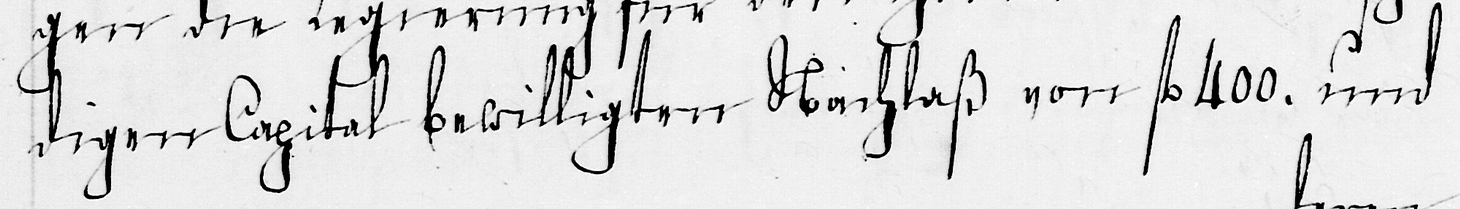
digen Capital bewilligten Nachlaß von fl. 400. und
